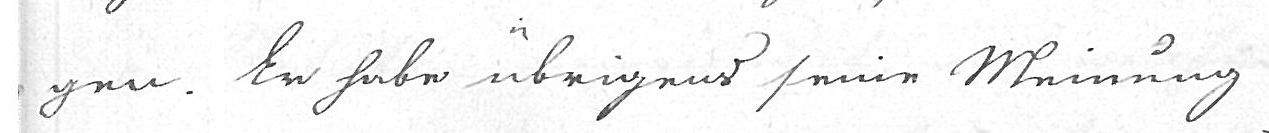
gen. Er habe übrigens seine Meinung
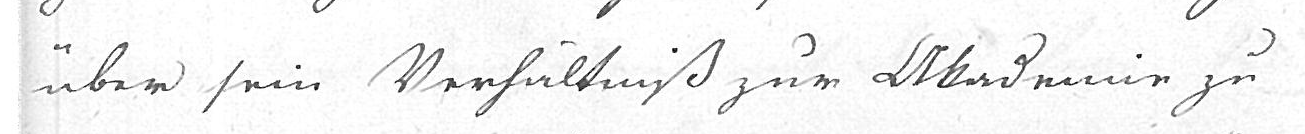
über sein Verhältniß zur Akademie zu
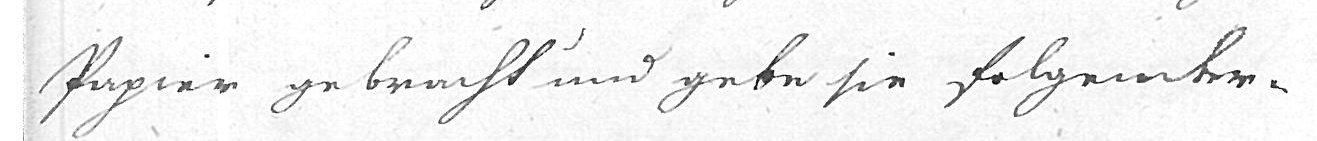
Papier gebracht und gebe sie folgender-
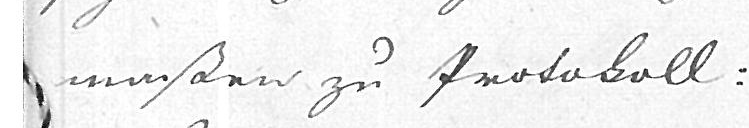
maßen zu Protokoll:
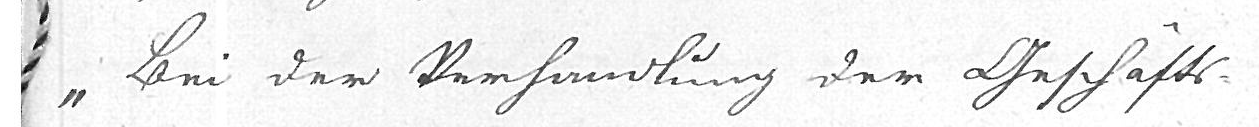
Bei der Verhandlung der Geschäfts-
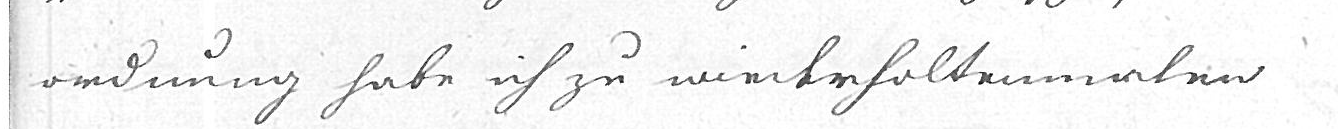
ordnung habe ich zu wiederholtenmalen
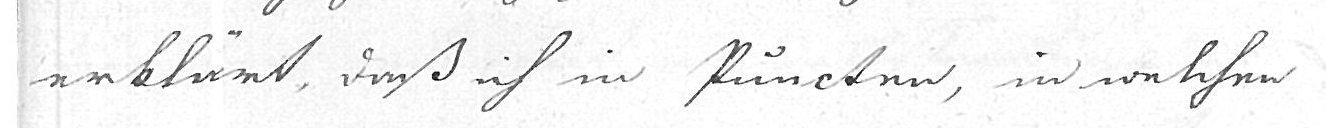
erklärt, daß ich in Puncten, in welchen
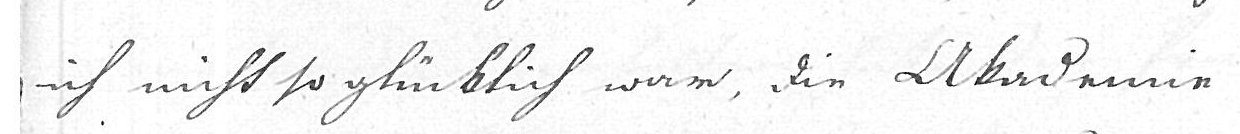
ich nicht so glücklich war, die Akademie
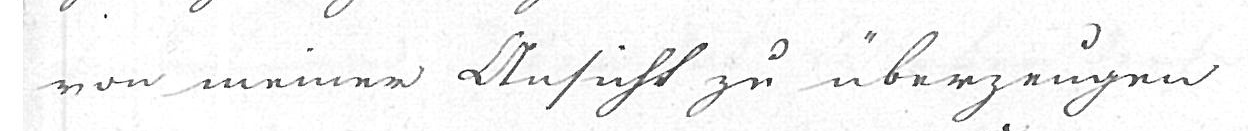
von meiner Aufsicht zu überzeugen
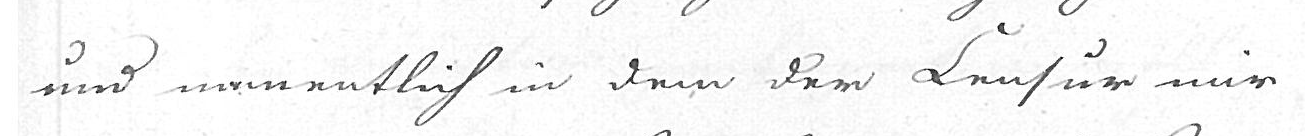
und namentlich in dem der Censur mir
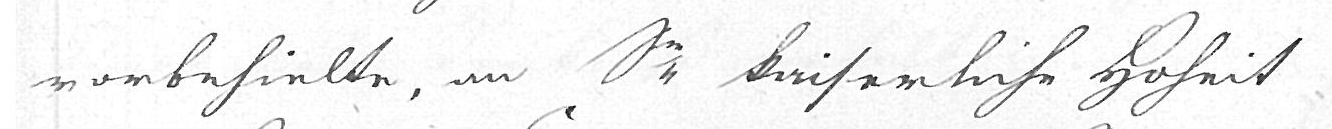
vorbehielte, an Sr. kaiserliche Hoheit
